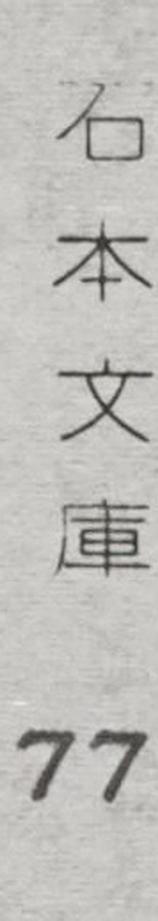石本文庫

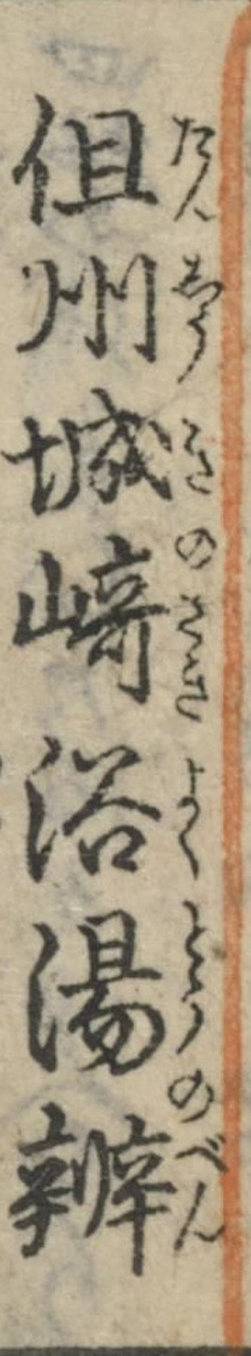但州城崎浴湯弁
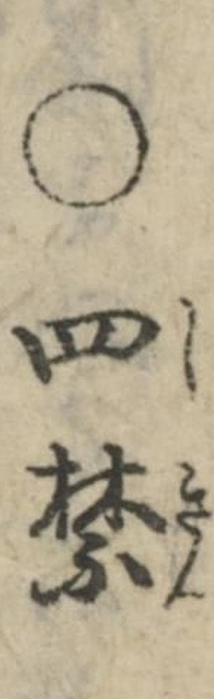○四禁
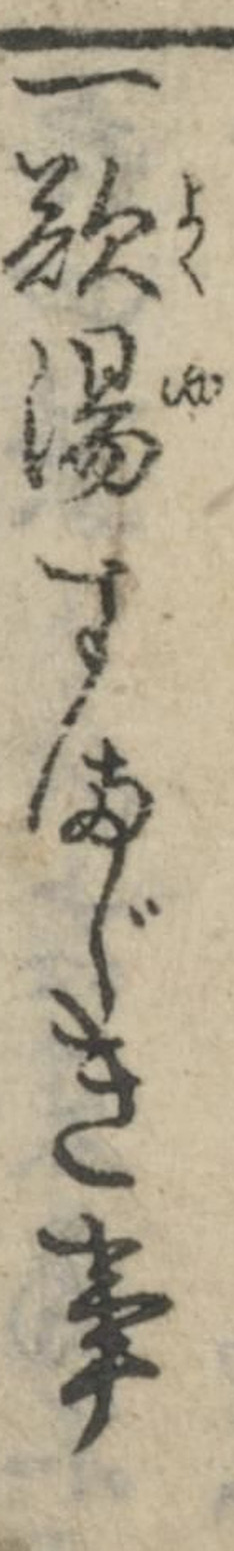一欲湯すまじき事
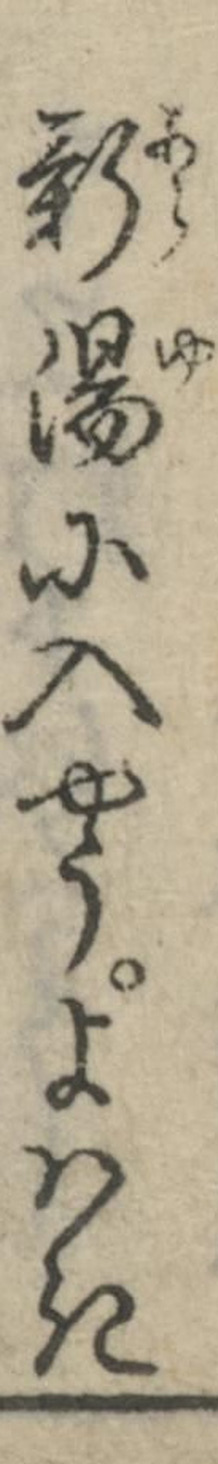新湯に入やう。よはき
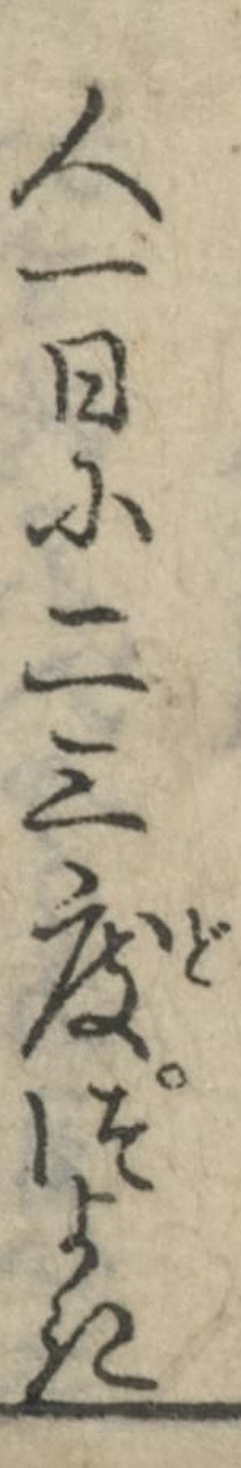人一日に二三度。つよき
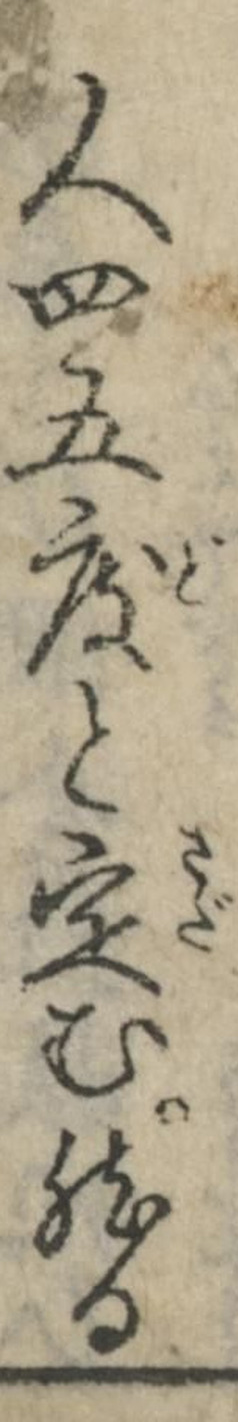人四五度と定む。然る
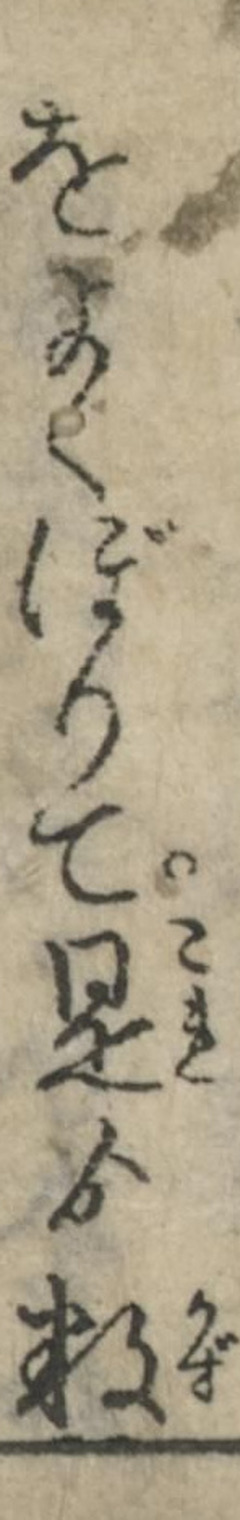をよくぼりて。是ゟ数
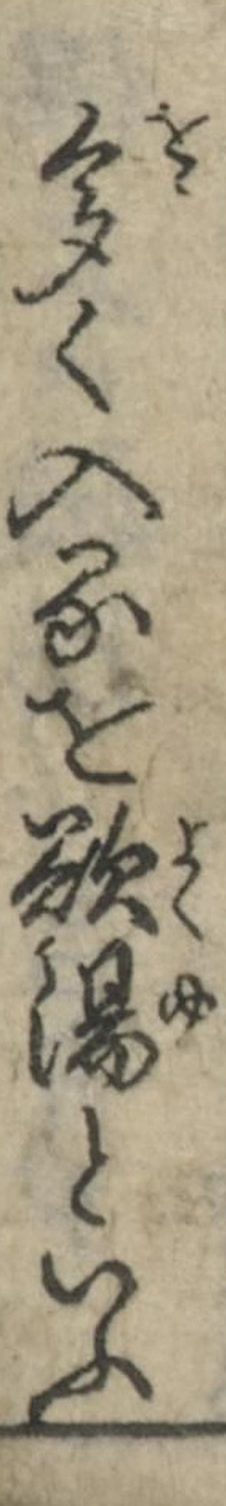多く入るを欲湯といふ
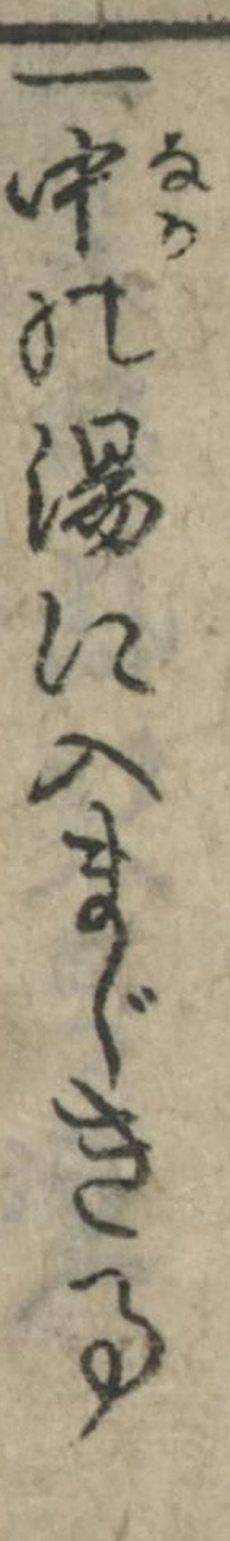一中の湯に入まじき事
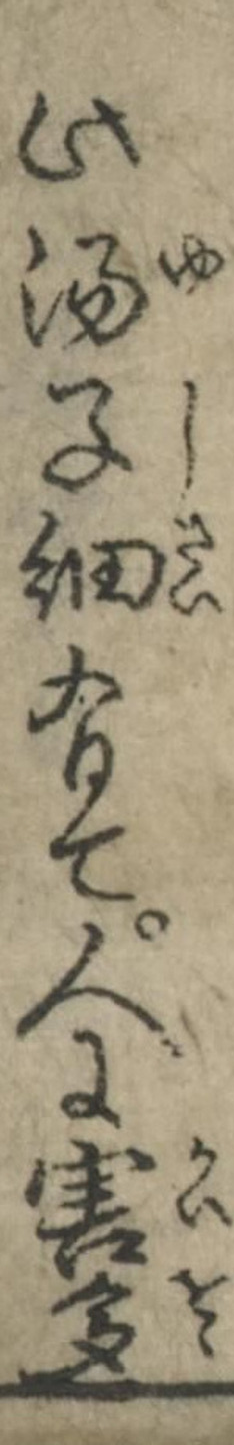此湯子細有て。人に害多

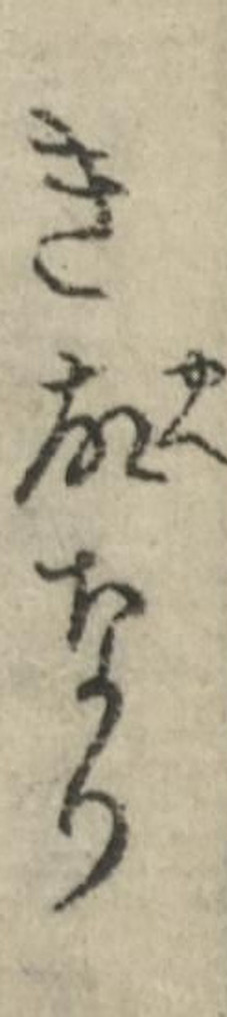き故なり
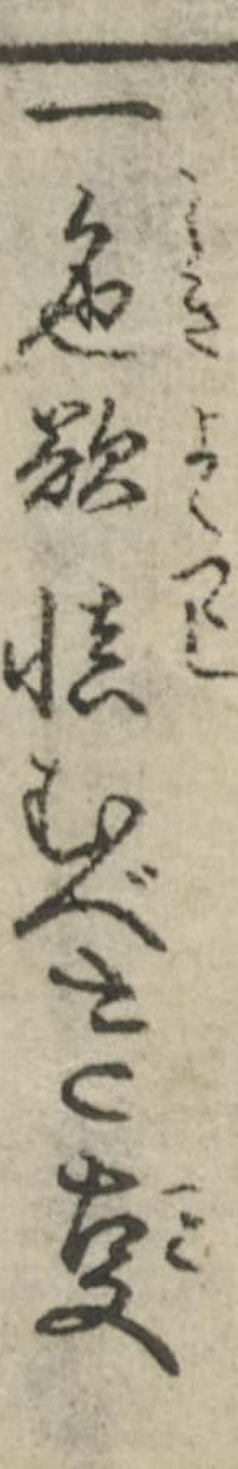一色欲慎むべき事
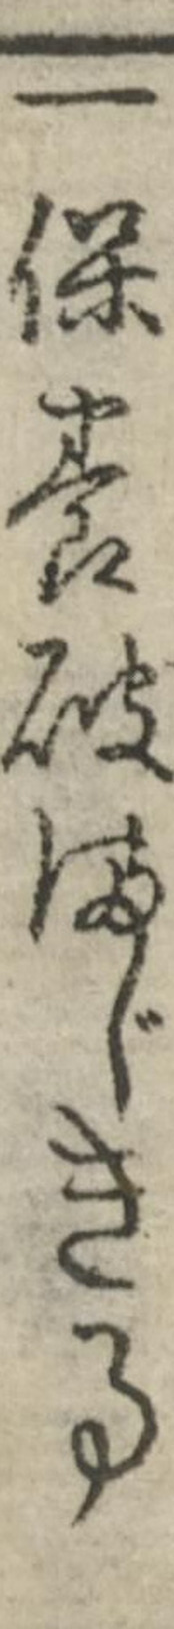一保養破まじき事
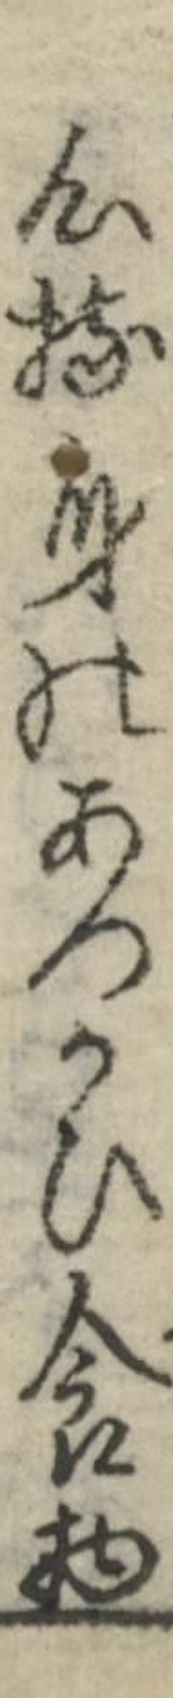心持身のあつかひ食物
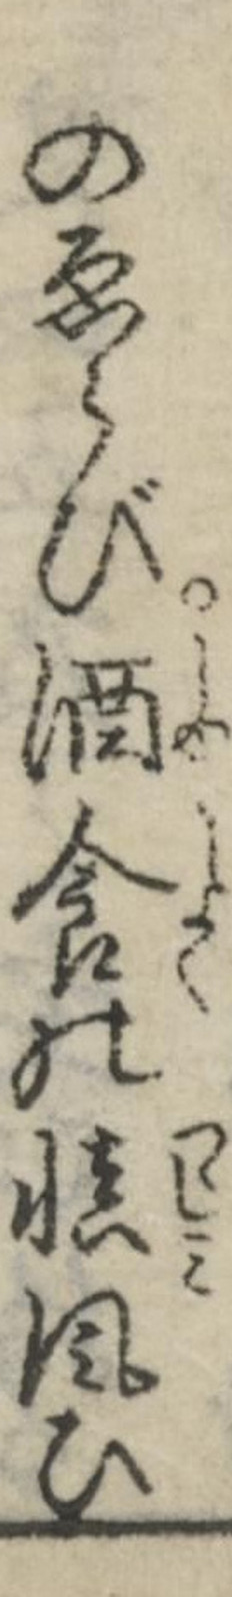のえらび。酒食の慎風ひ
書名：但州城崎浴湯辧
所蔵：東京大学地震研究所図書室 Earthquake Research Institute Library, The University of Tokyo, JAPAN
